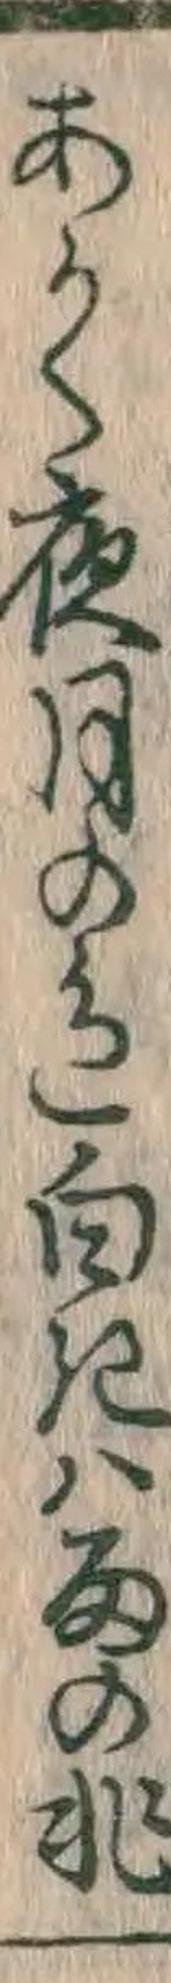あかく夜月の色白きは雨の兆
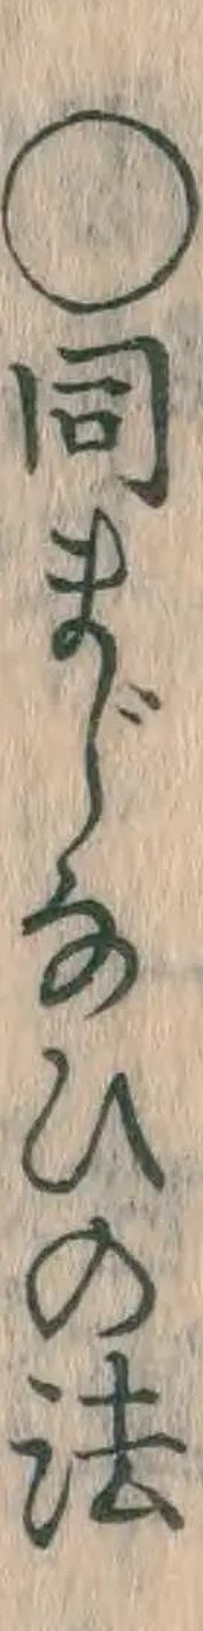○同まじなひの法
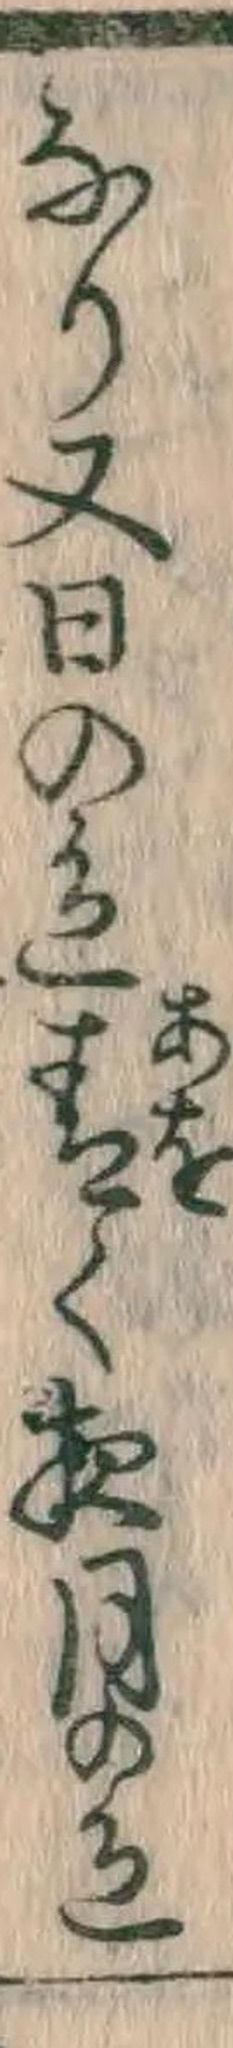なり又日の色青く夜月の色
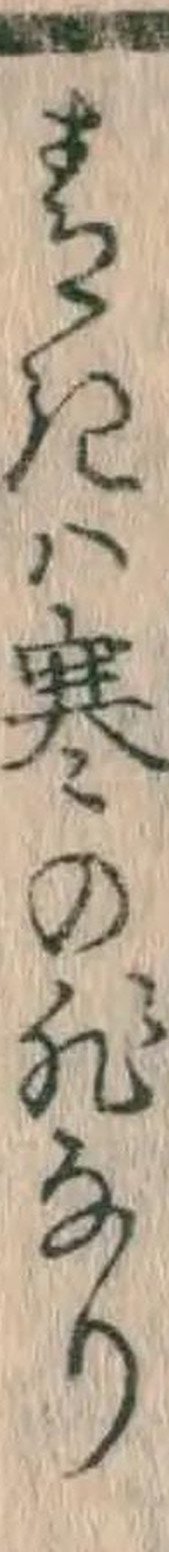青きは寒の兆なり
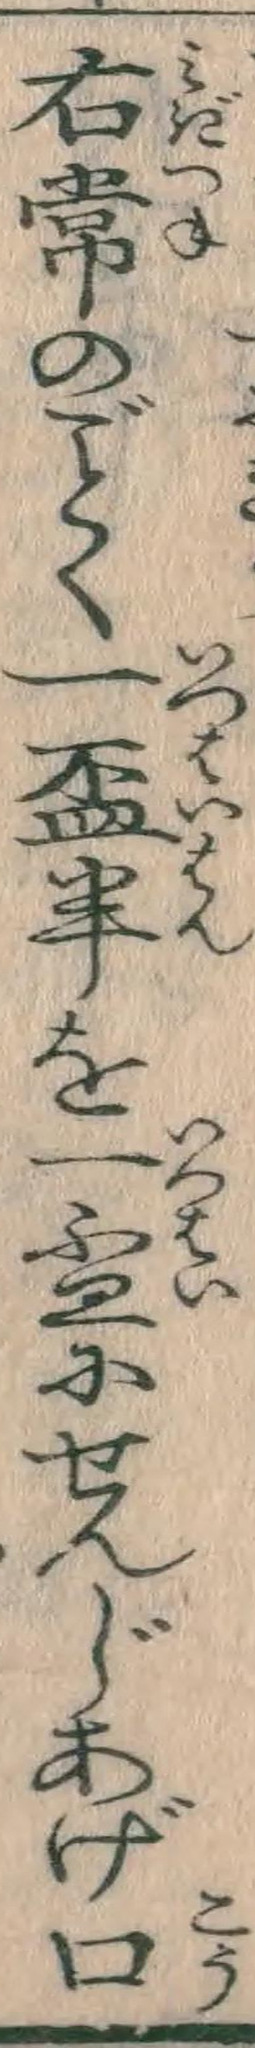右常のごとく一盃半を一盃にせんじあげ口
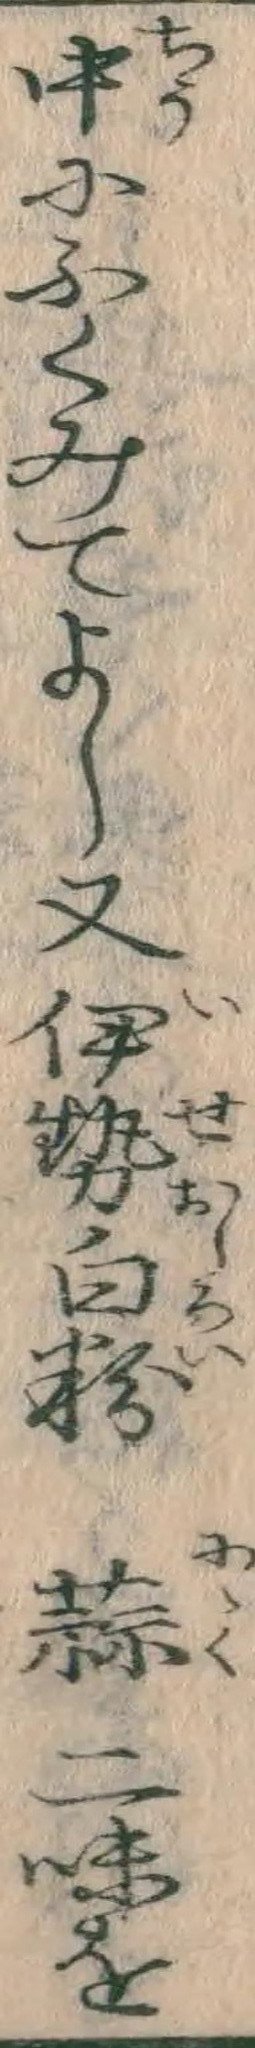中にふくみてよし又伊勢白粉蒜二味を
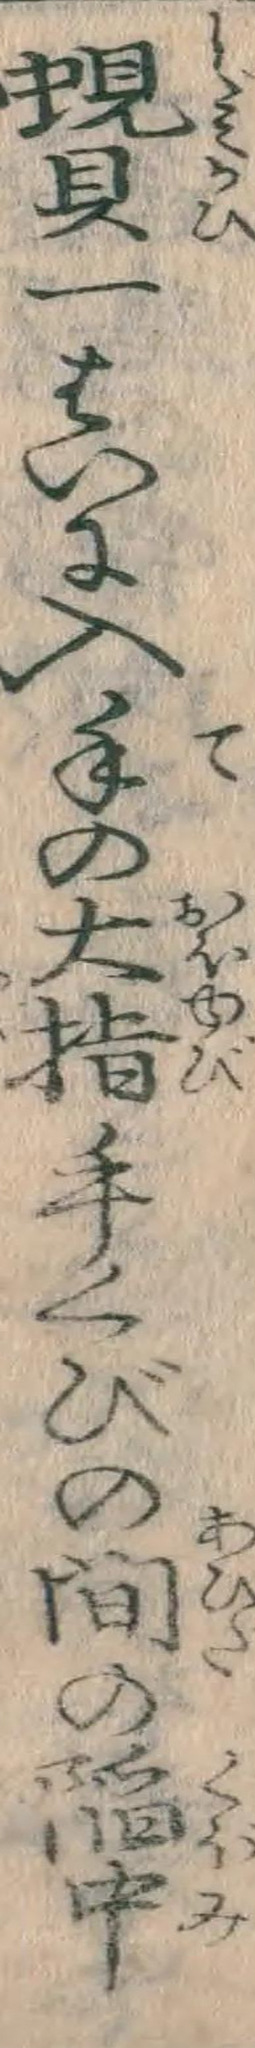蜆貝一はいに入手の大指手くびの間の陷中
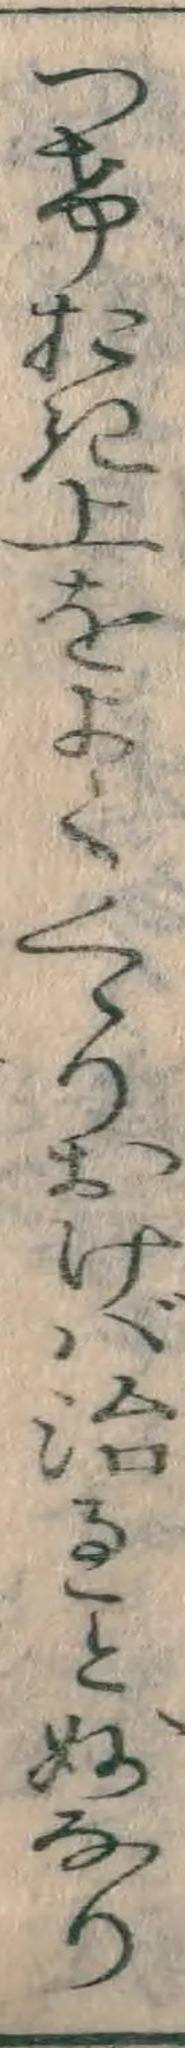つけおき上をよくくゝりおけば治ること妙なり
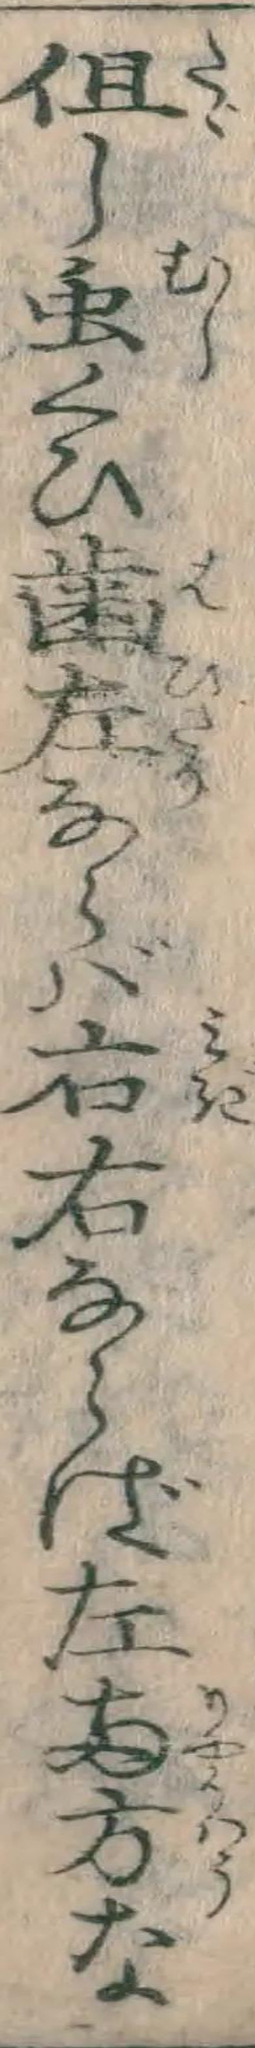但し虫くひ歯左ならば右右ならば左両方な
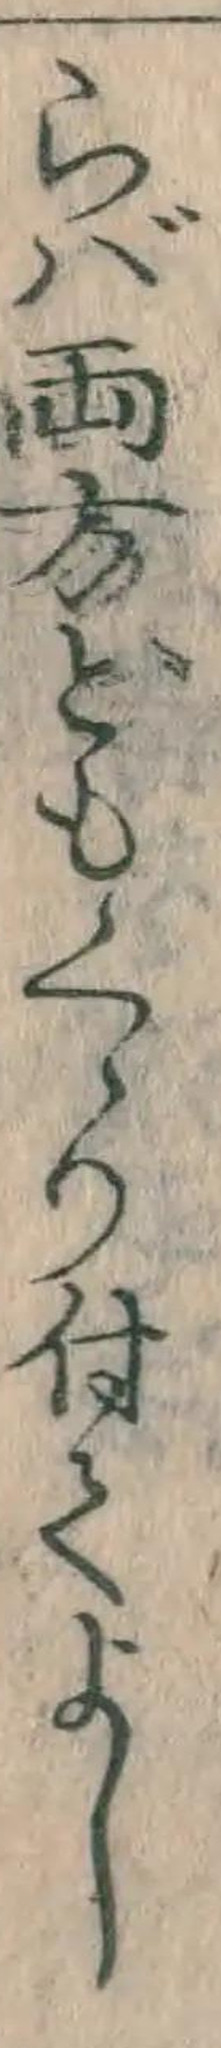らば両方どもくゝり付てよし

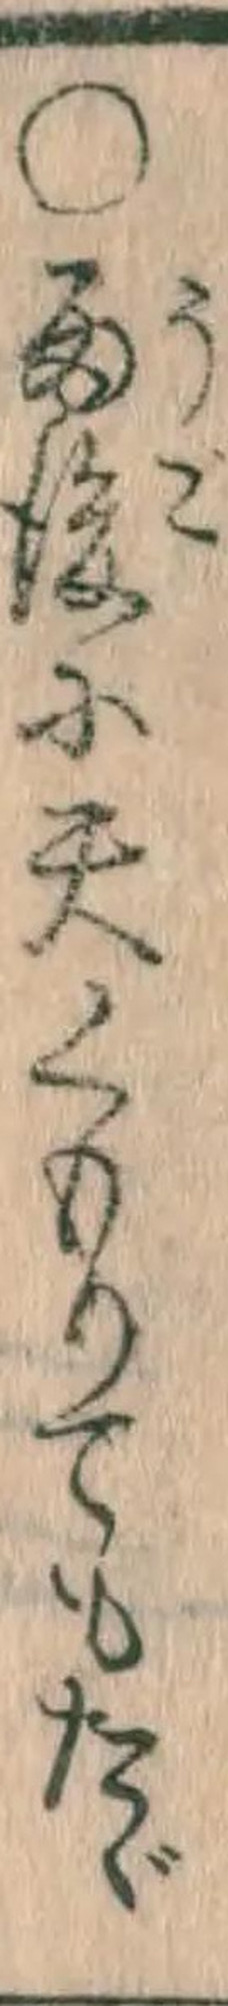○雨後に天くもりてもたゞ
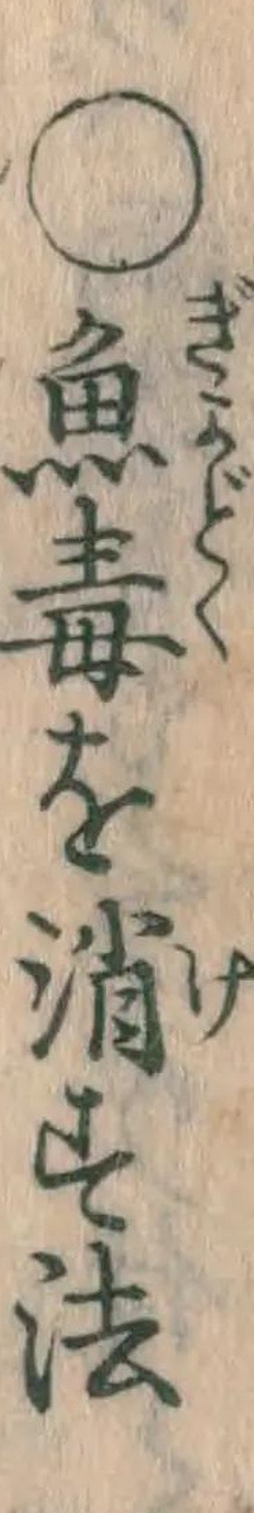○魚毒を消す法
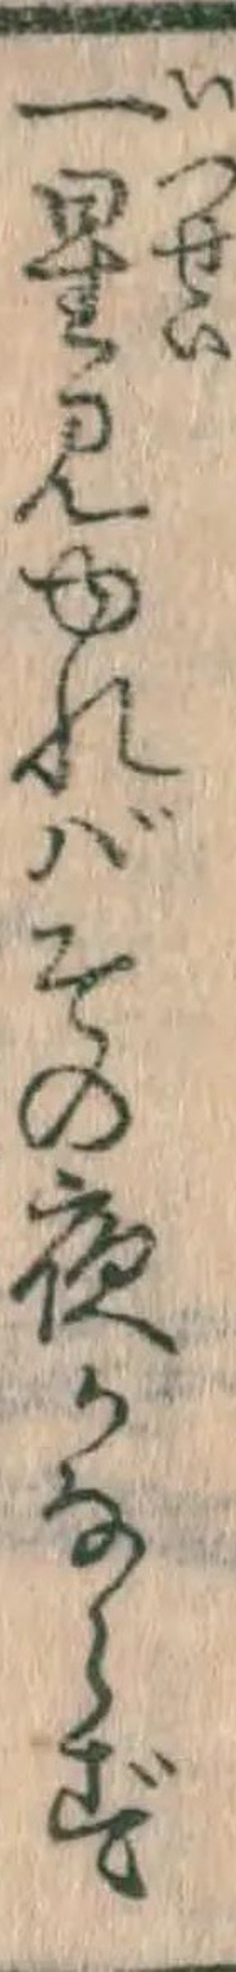一星見ゆればその夜かならず
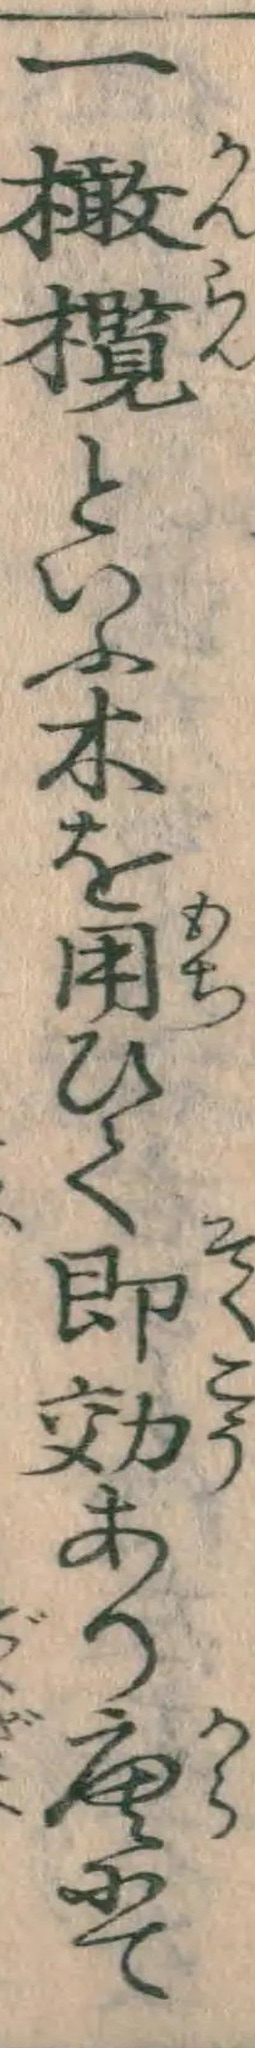一橄欖といふ木を用ひて即効あり唐にて
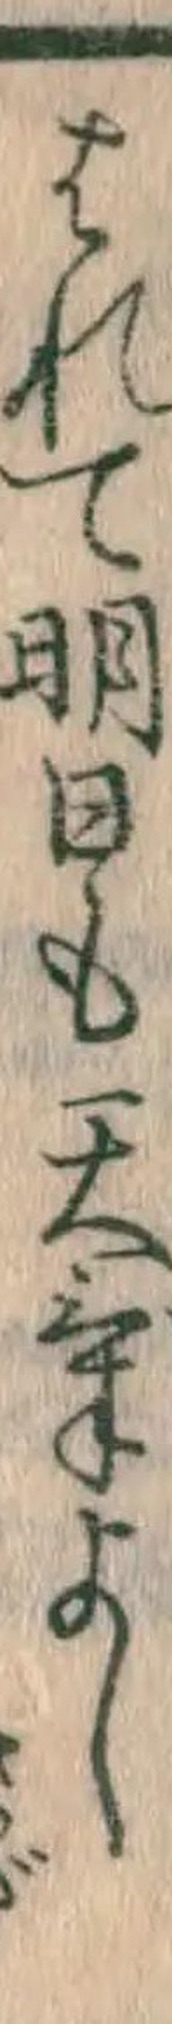はれて明日も天気よし
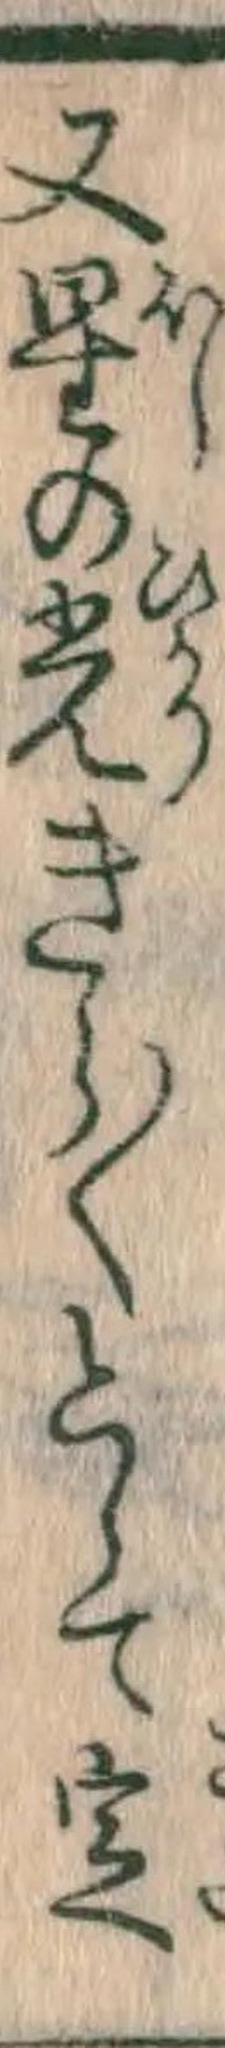又星の光きら〳〵として定
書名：広益秘事大全 3巻. [3]
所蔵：国立国会図書館 National Diet Library, JAPAN
